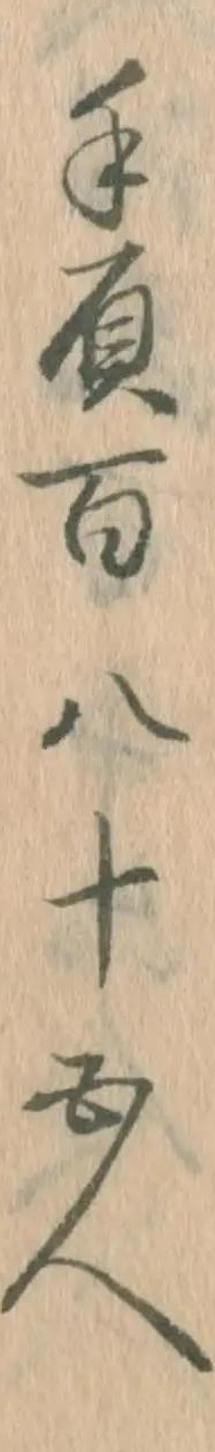手負百八十五人
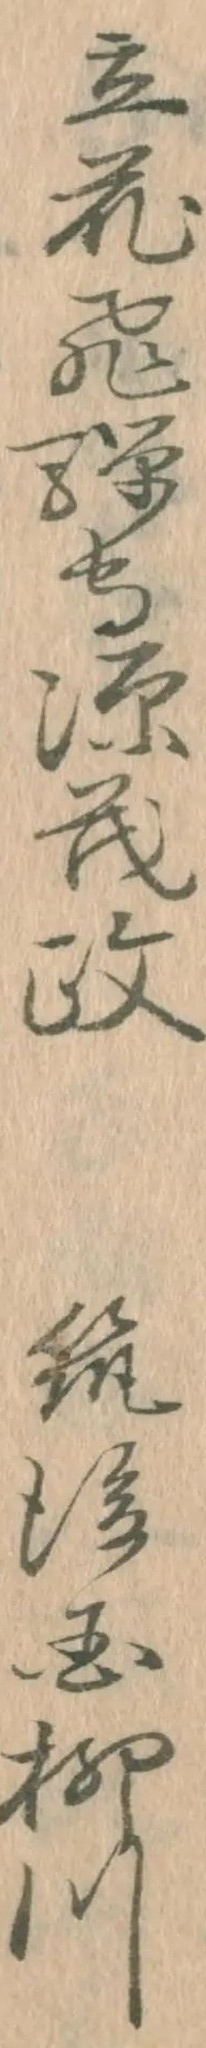立花飛騨守源茂政筑後国柳川
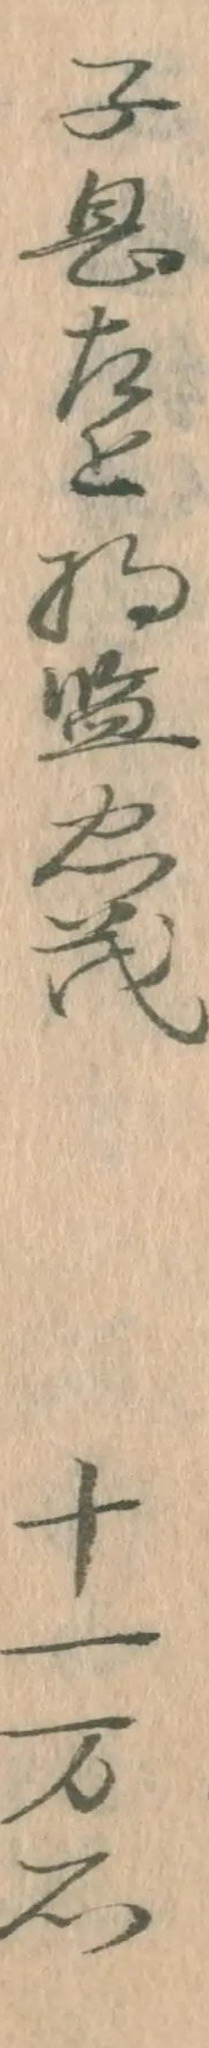子息左近将監忠茂十一万石
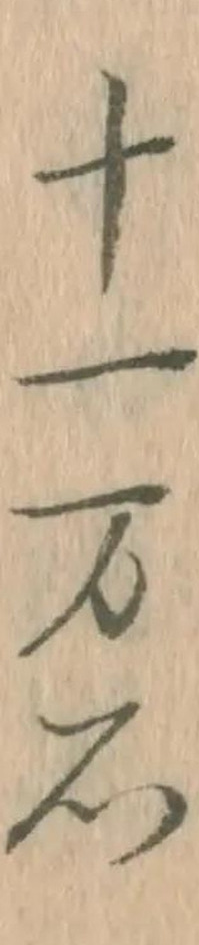十五万石
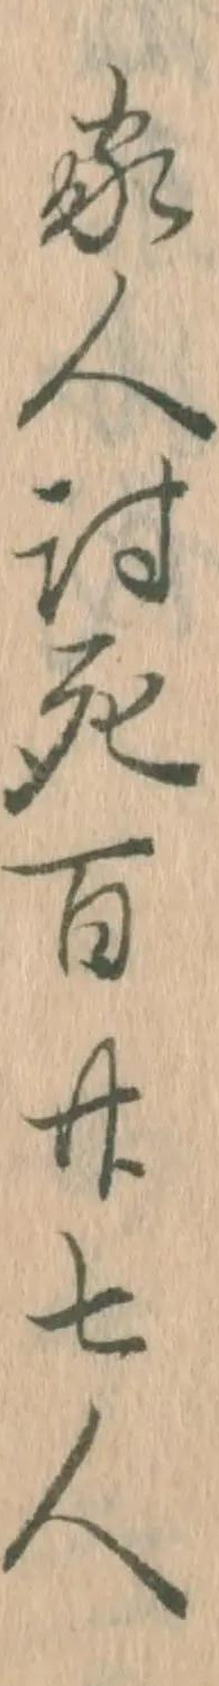家人討死百廿七人
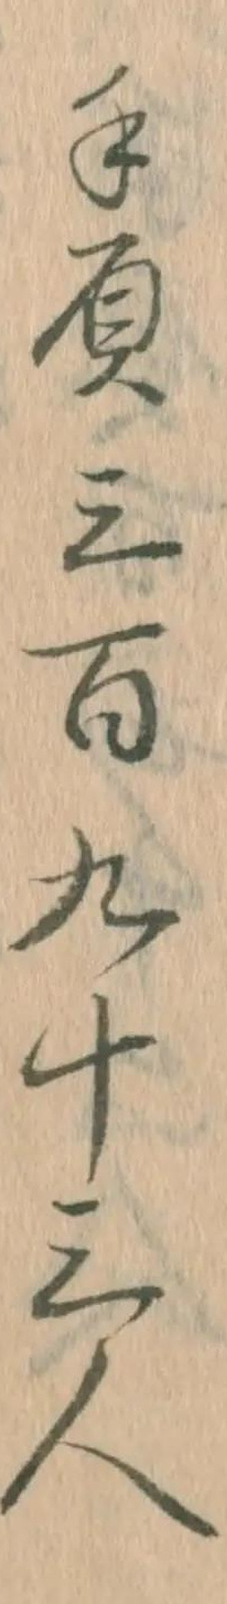手負三百九十三人
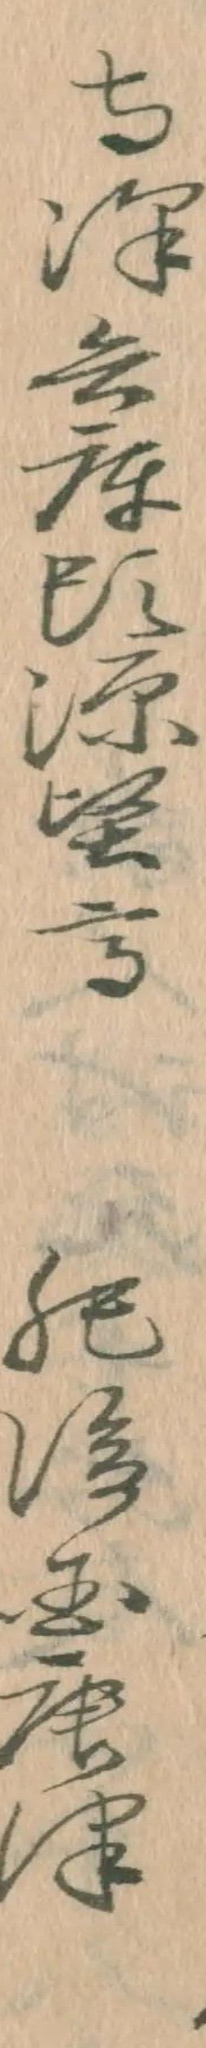寺沢兵庫頭源堅高肥後国唐津
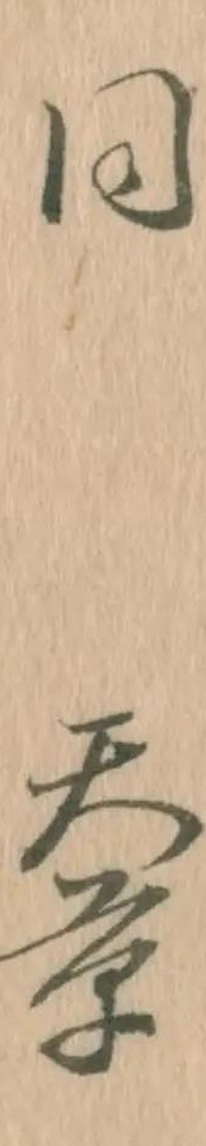同天草
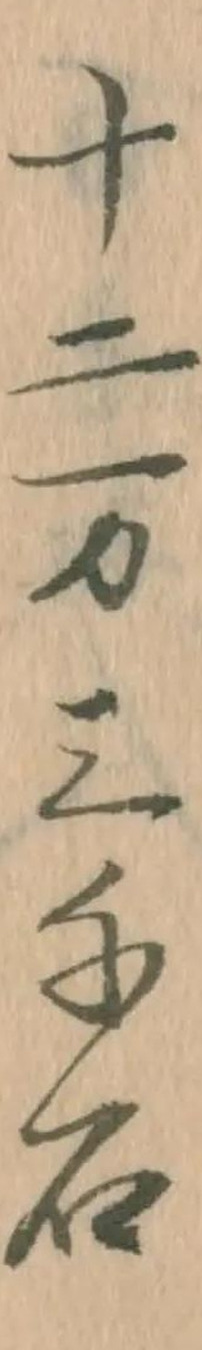十二万三千石
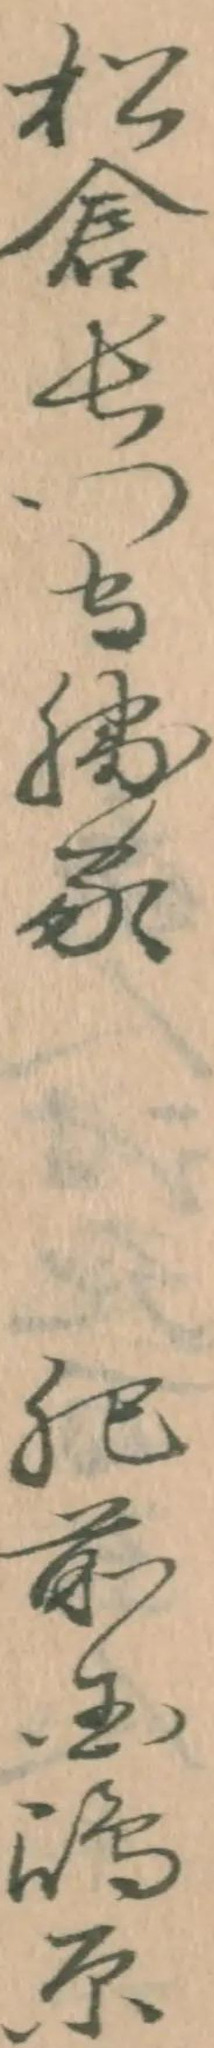松倉長門守勝家肥前国島原
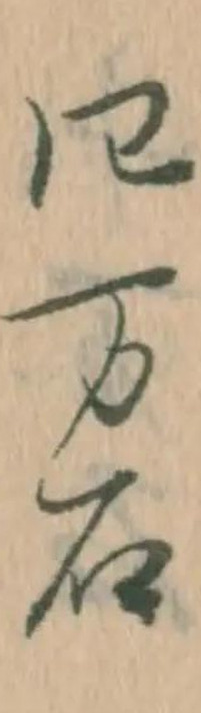八万石
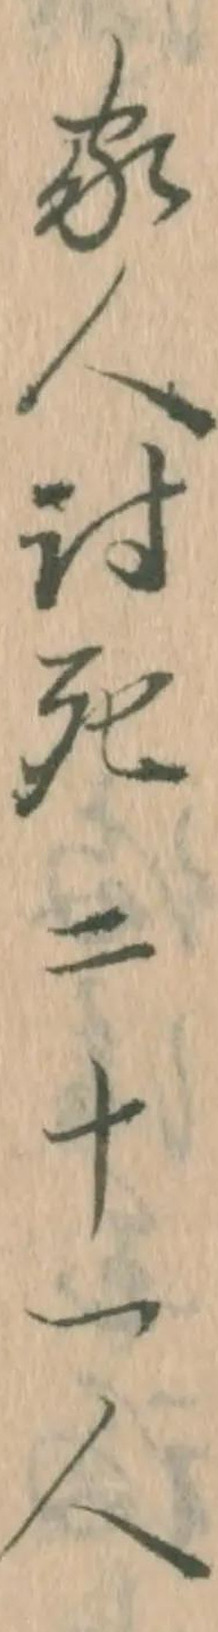家人討死二十一人
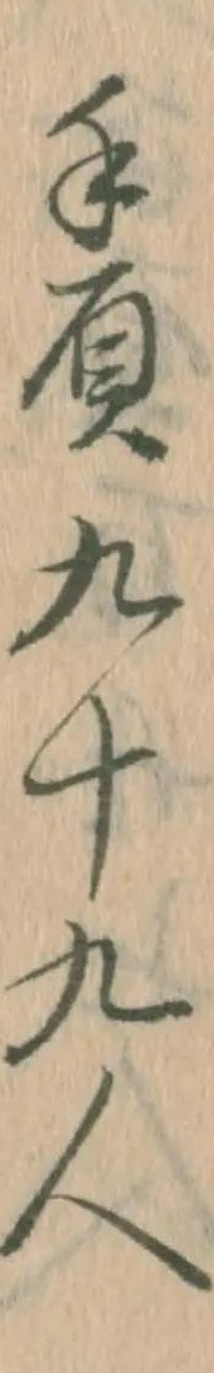手負九十九人
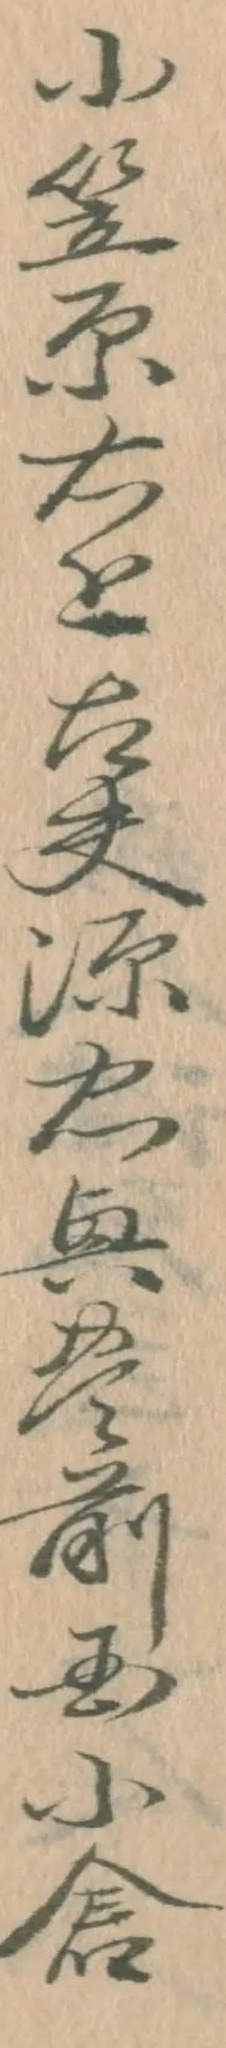小笠原右近太夫厳忠興豊前国小倉
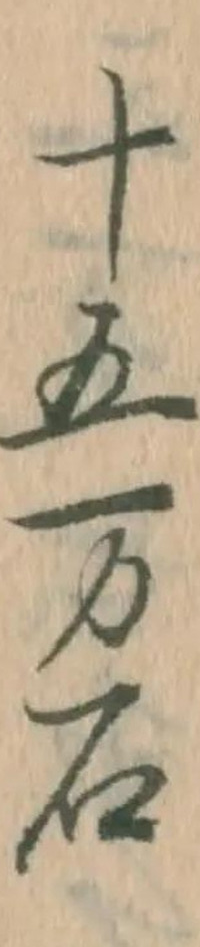十五万石
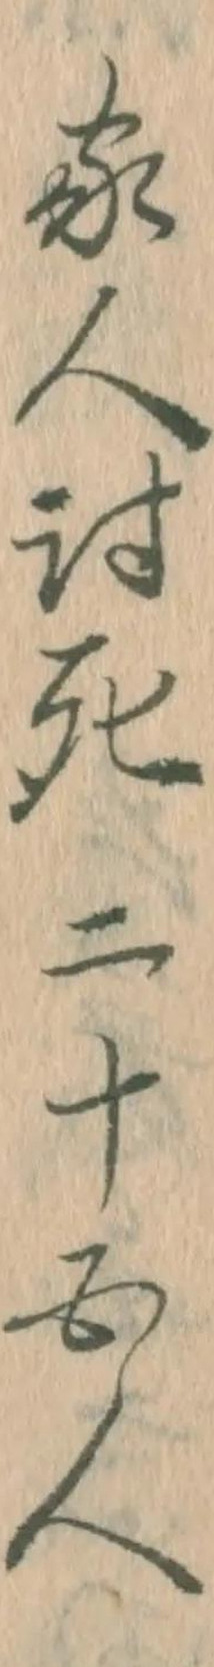家人討死二十五人
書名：切支丹御退治記 49巻. [9]
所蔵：国立国会図書館 National Diet Library, JAPAN
